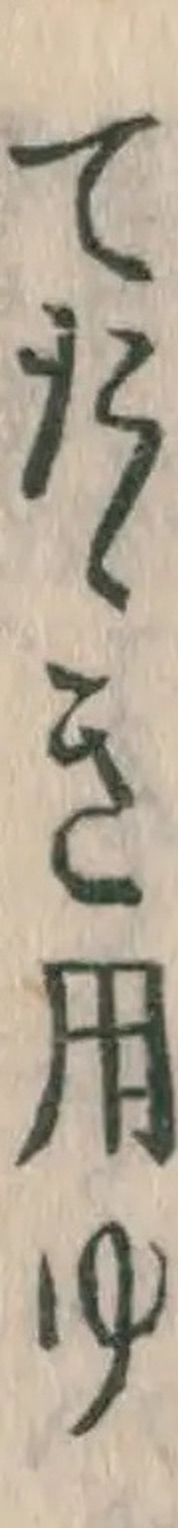てたゝき用ゆ
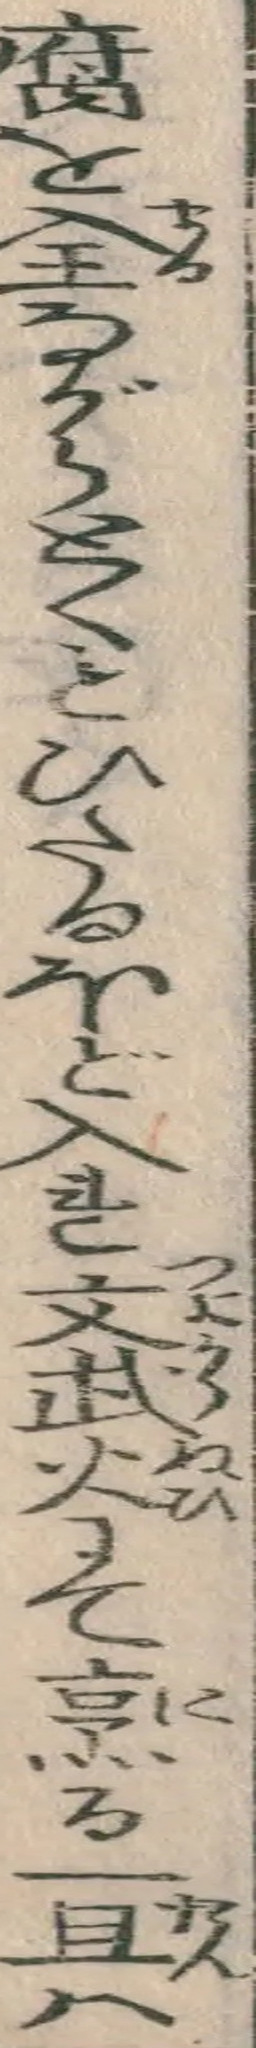腐を全ながらとくとひたるほど入れ文武火にて烹る一旦は
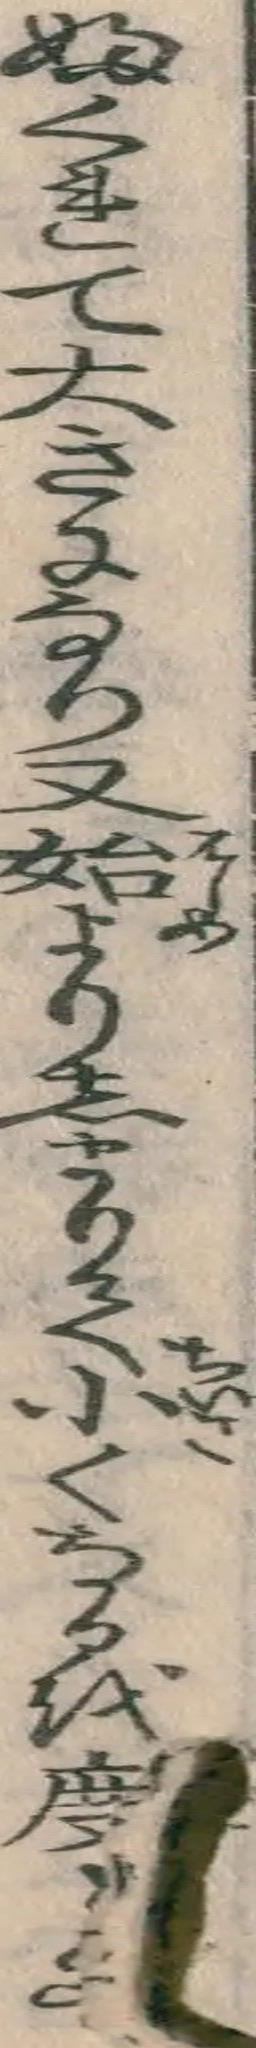ふくれて大きになり又始よりしまりて小さくなるを度とす
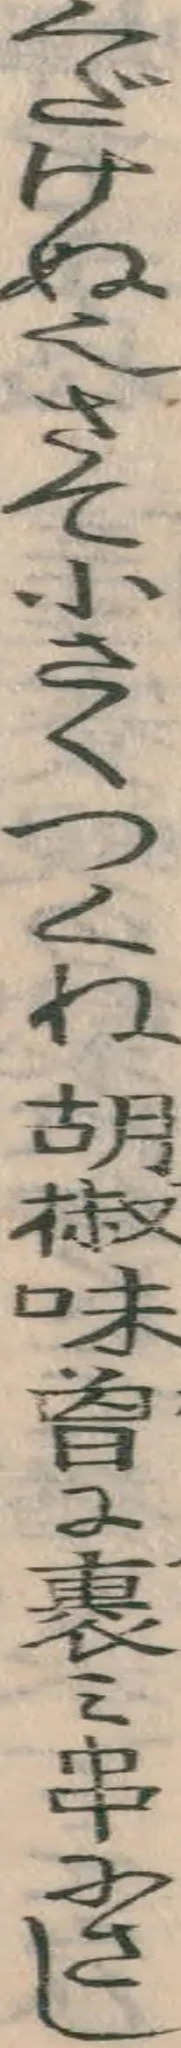くだけぬ也さて小さくつくね胡椒味曽に裹み串にさし
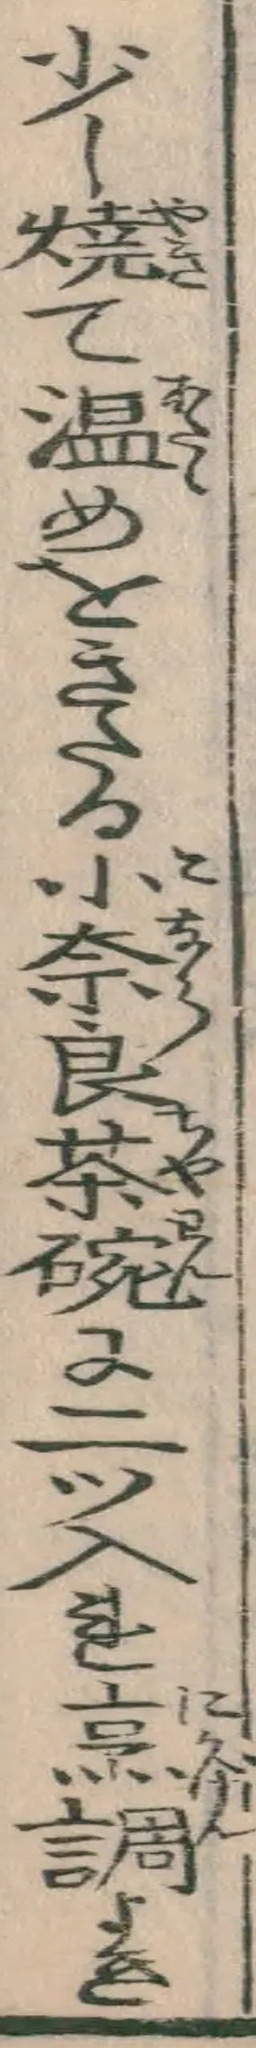少し焼て温めをきたる小奈良茶碗に二ツ入れ烹調よき
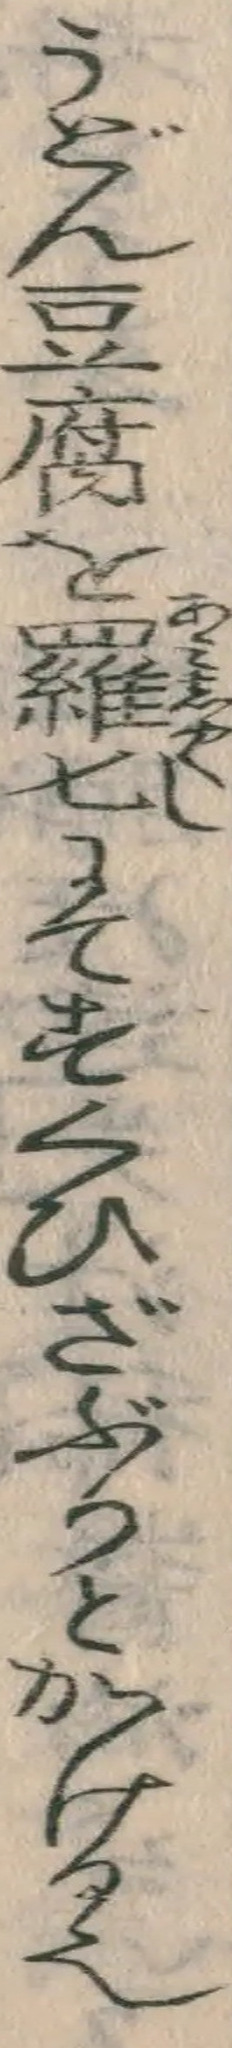うどん豆腐を羅匕にてすくひざぶりとかける也
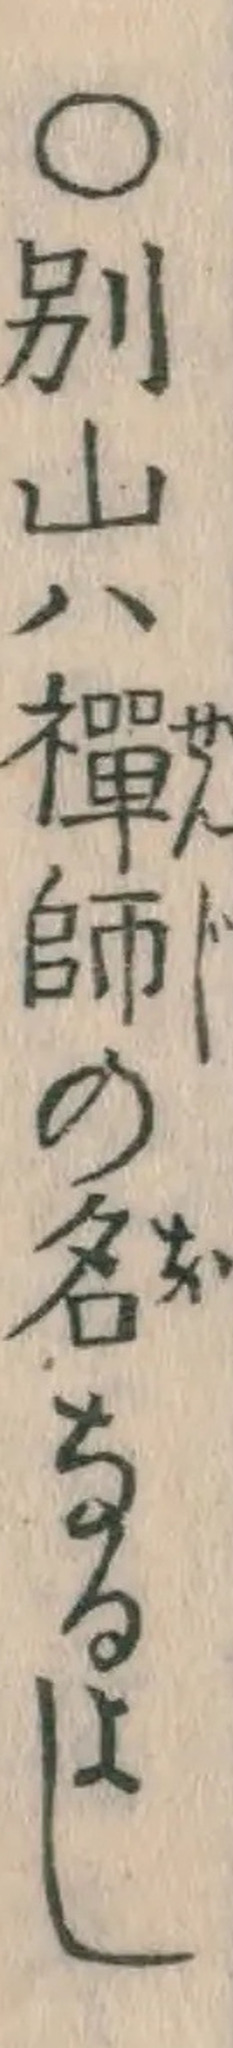◯別山は禅師の名なるよし
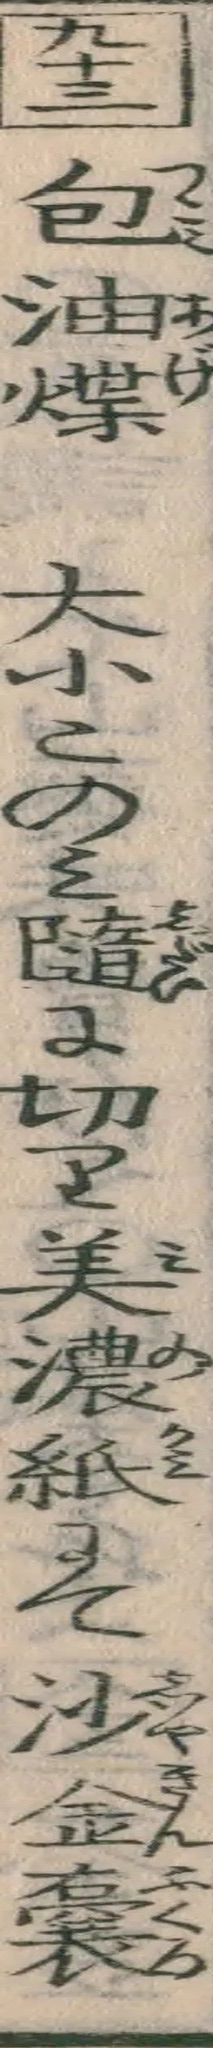[九十三]包油煠大小このみに随に切り美濃紙にて沙金袋
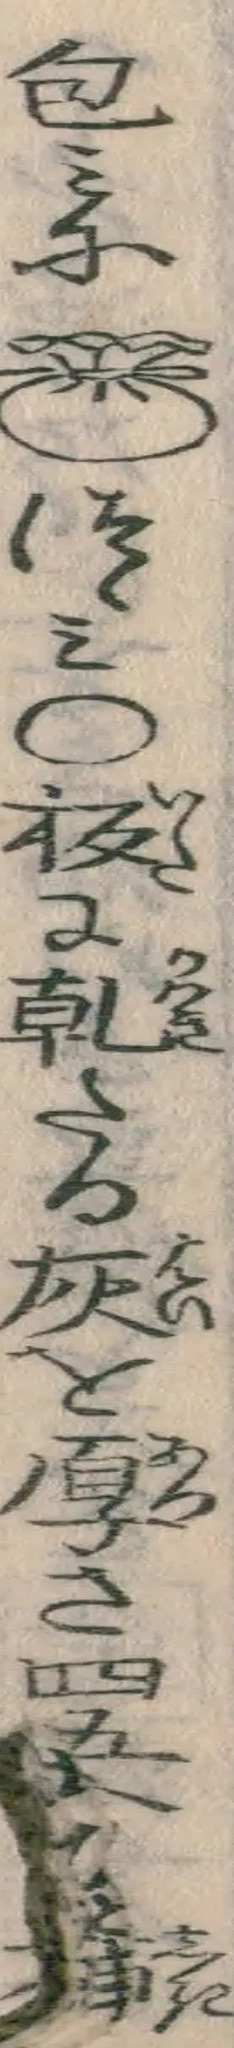包みにつゝみ◯板に乾たる灰を厚さ四五分に布
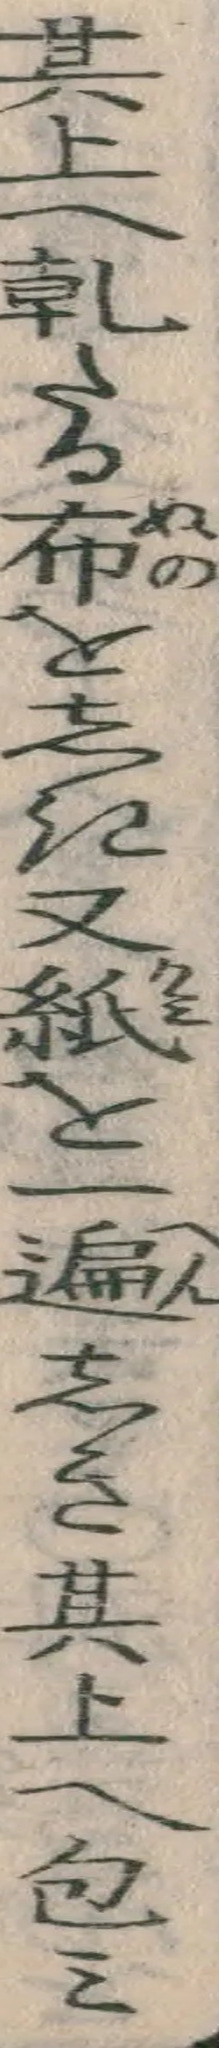其上へ乾たる布をしき又紙を一遍しき其上へ包み
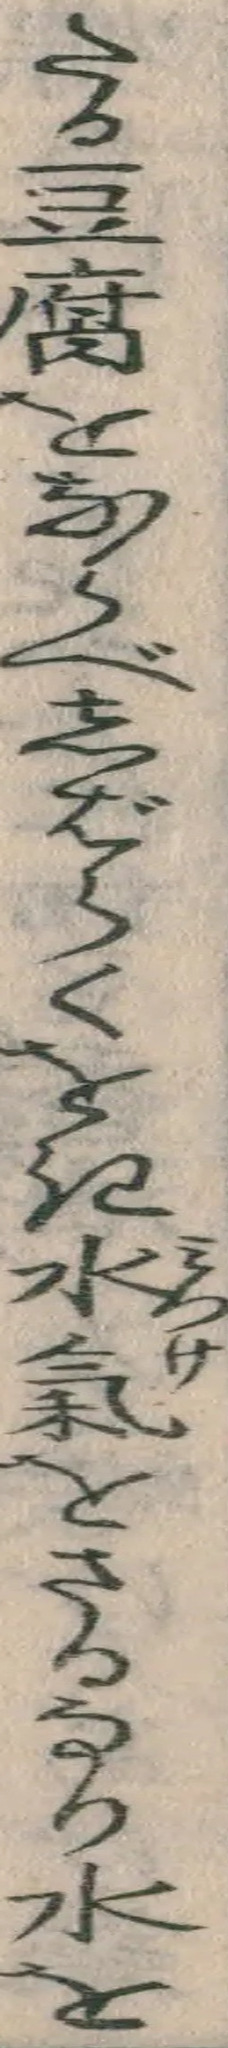たる豆腐をならべしばらくをき水気をさるなり水を
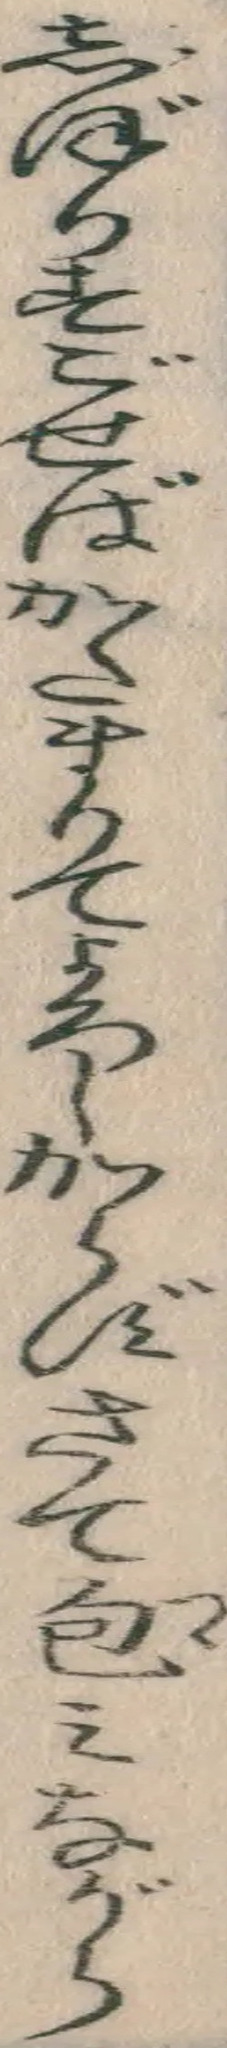しぼりすごせばかたまりてよろしからずさて包みながら
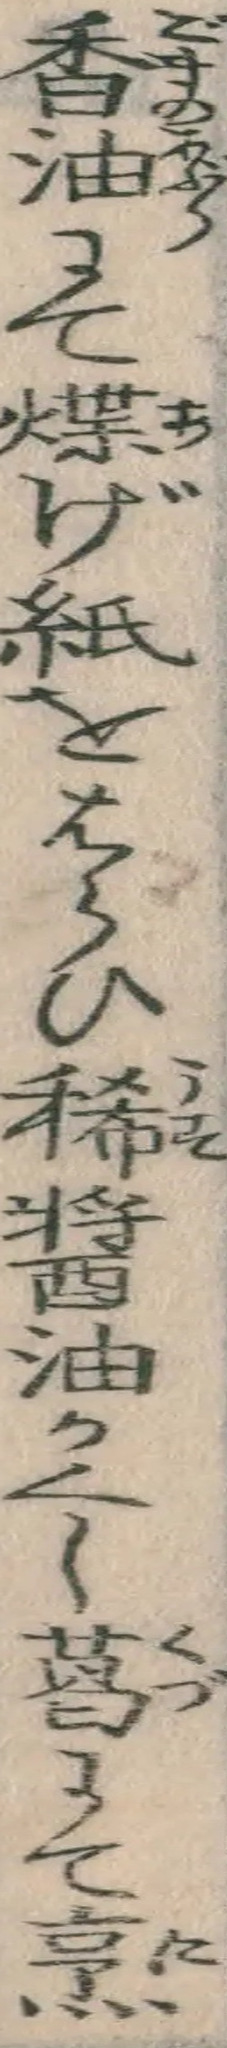香油にて煠げ紙をはらひ稀醤油かくし葛にて烹
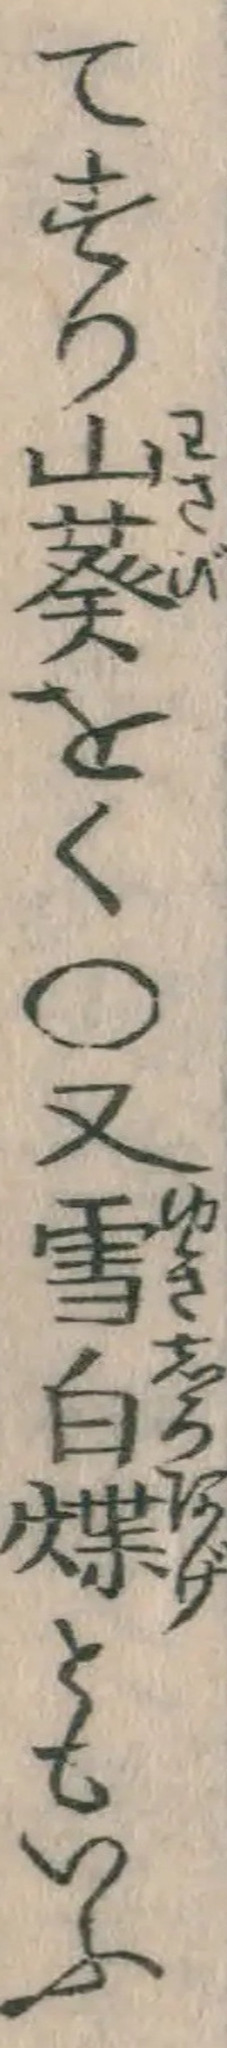てすり山葵をく◯又雪白煠ともいふ

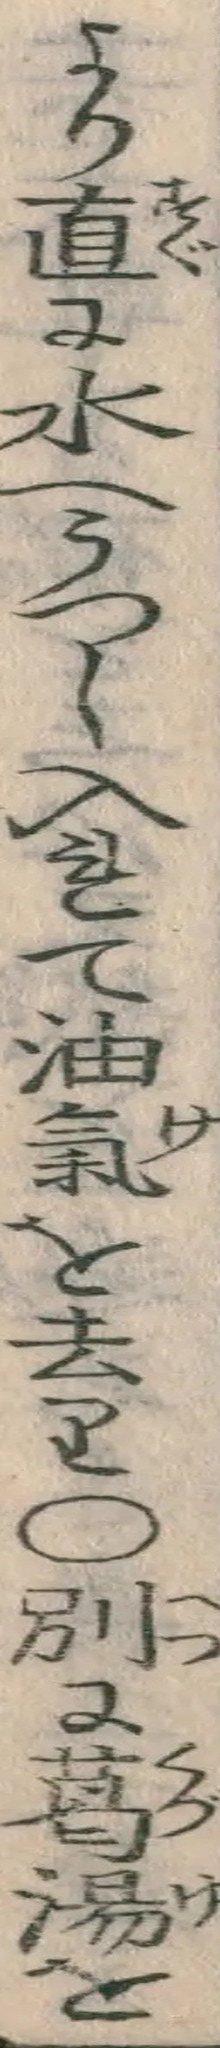より直に水へうつし入れて油気を去り◯別に葛湯を
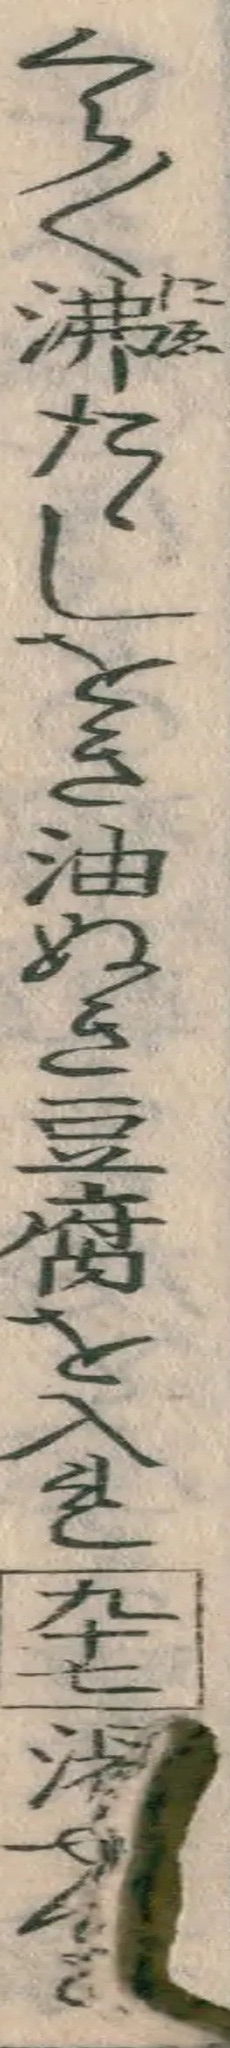くら〳〵沸たゝしをき油ぬき豆腐を入れ[九十七]湯やつこ
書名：豆腐百珍. [正編]
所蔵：国立国会図書館 National Diet Library, JAPAN
